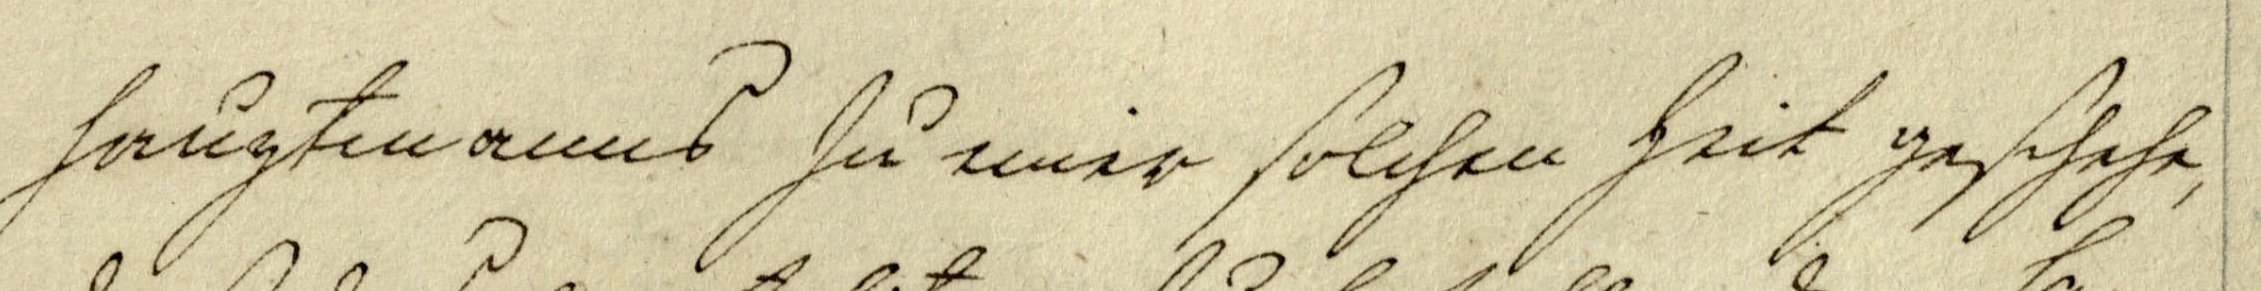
hauptmanns zu einer solchen Zeit geschehe,
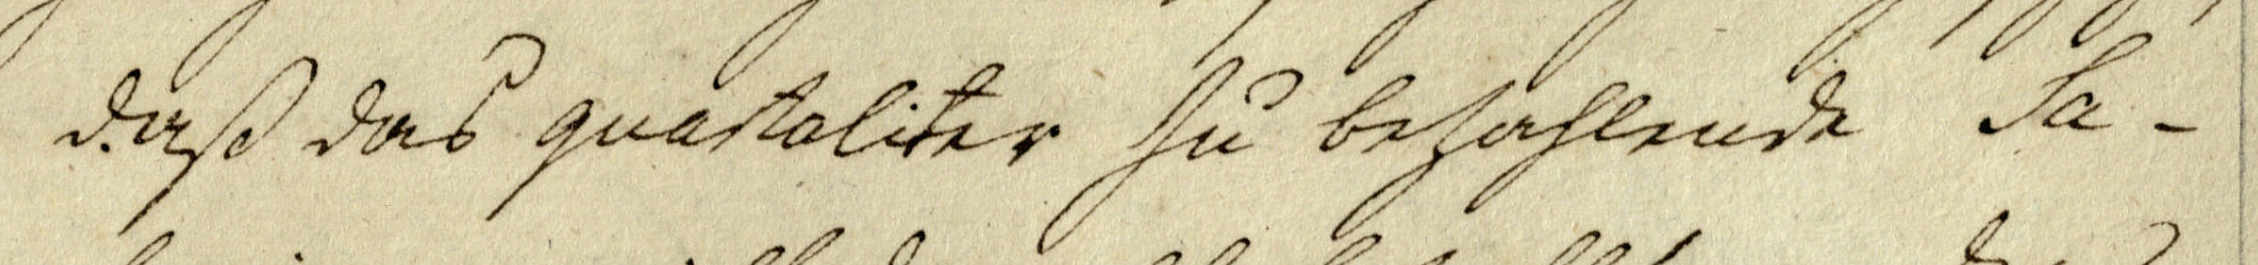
daß das quartaliter zu bezahlende Sa¬
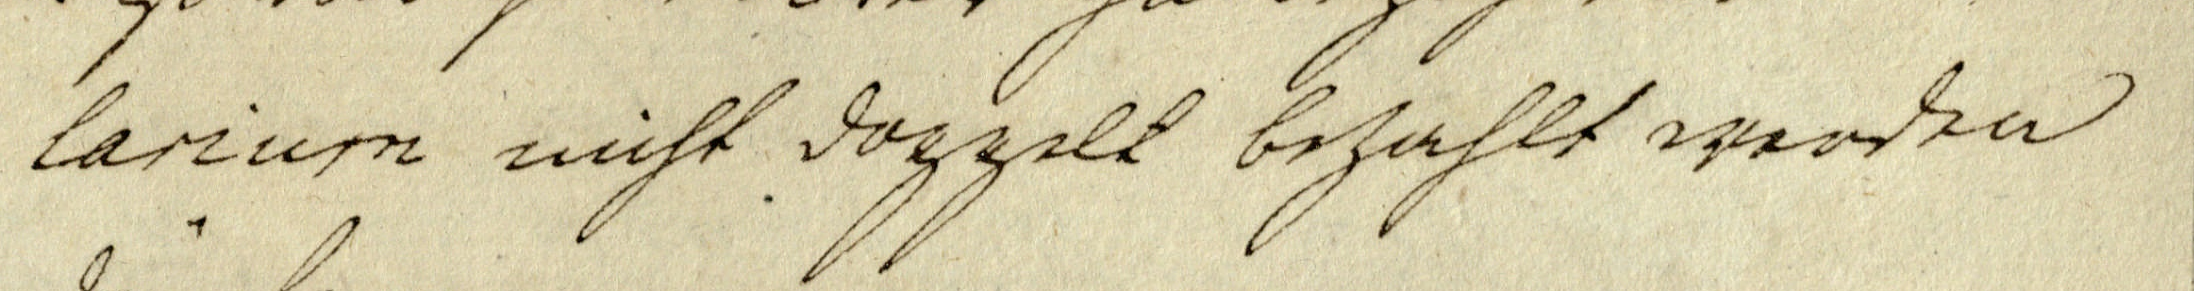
larium nicht doppelt bezahlt werden
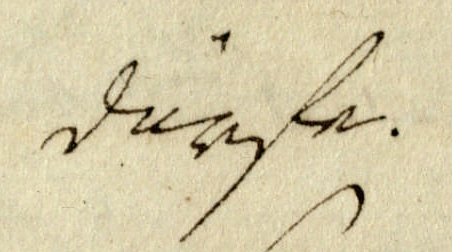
dürfe.
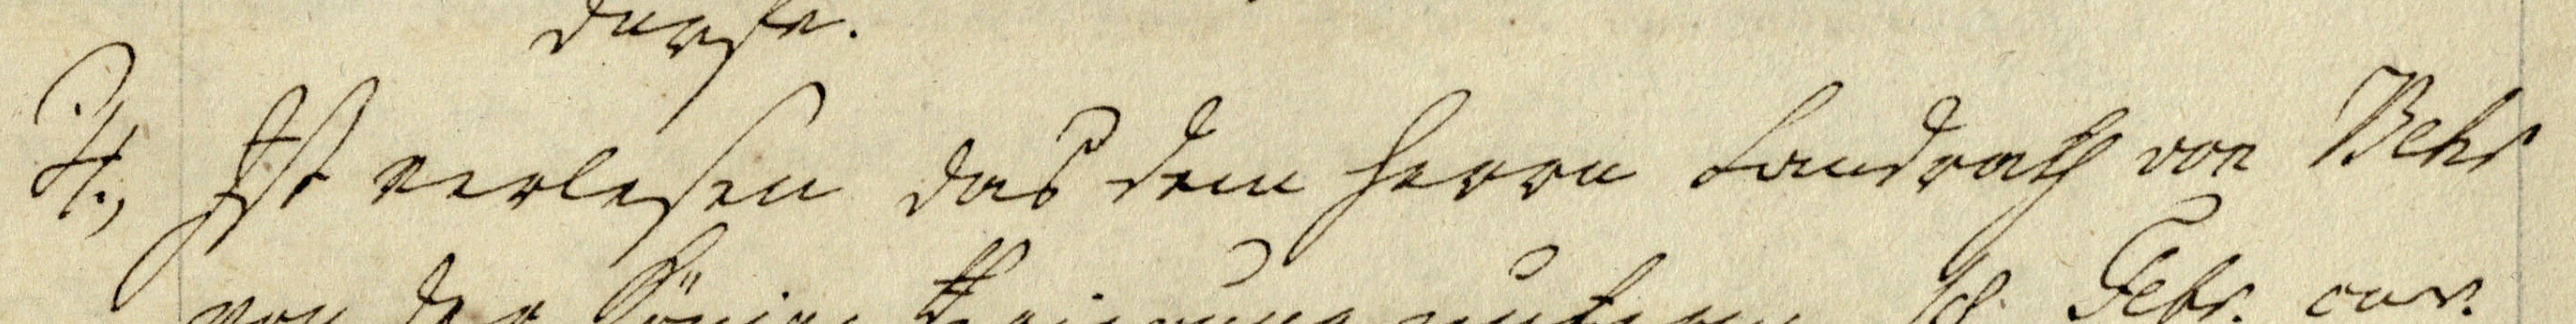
4., Ist verlesen das dem Herrn Landrath von Behr
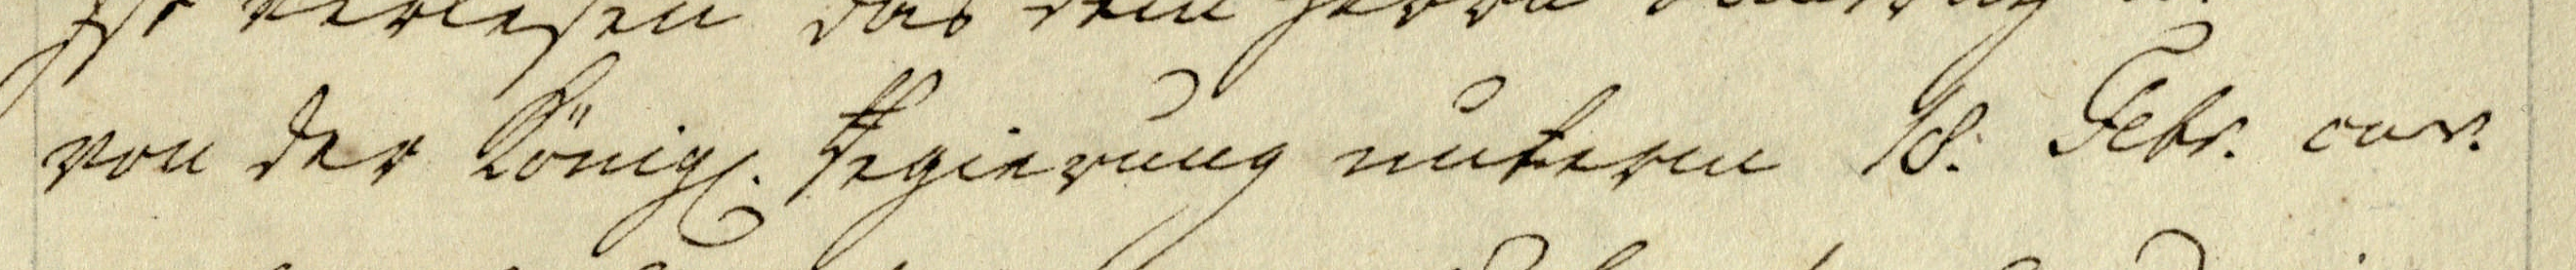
von der Königl Regierung unterm 18. Febr. cur.
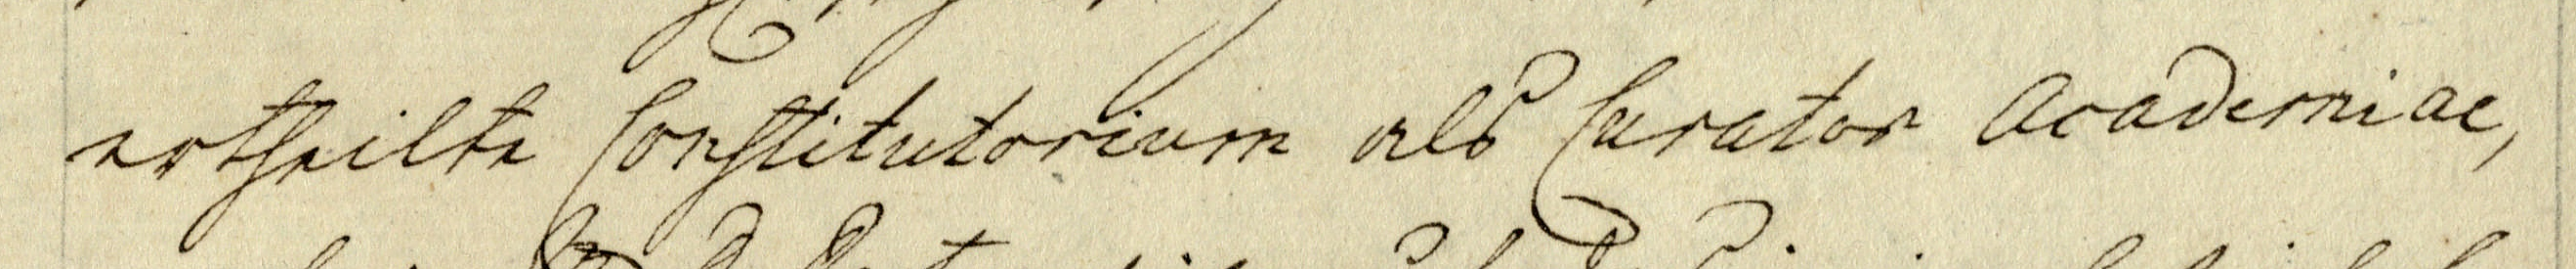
ertheilte Constitutorium als Curator Academiae,
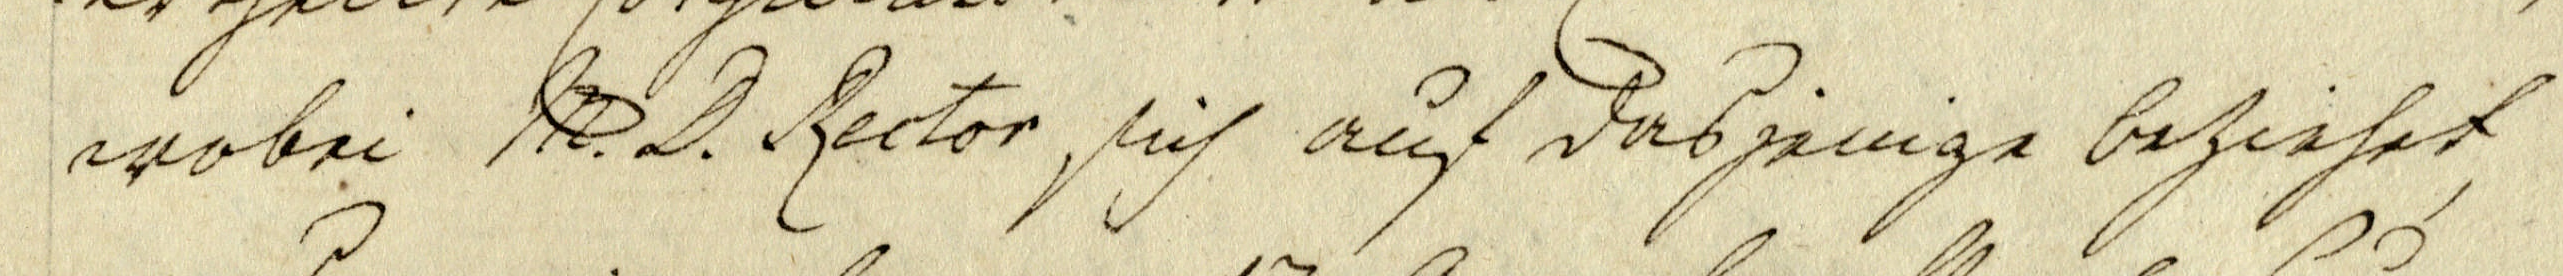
wobei M D. Rector sich auf dasjenige beziehet,
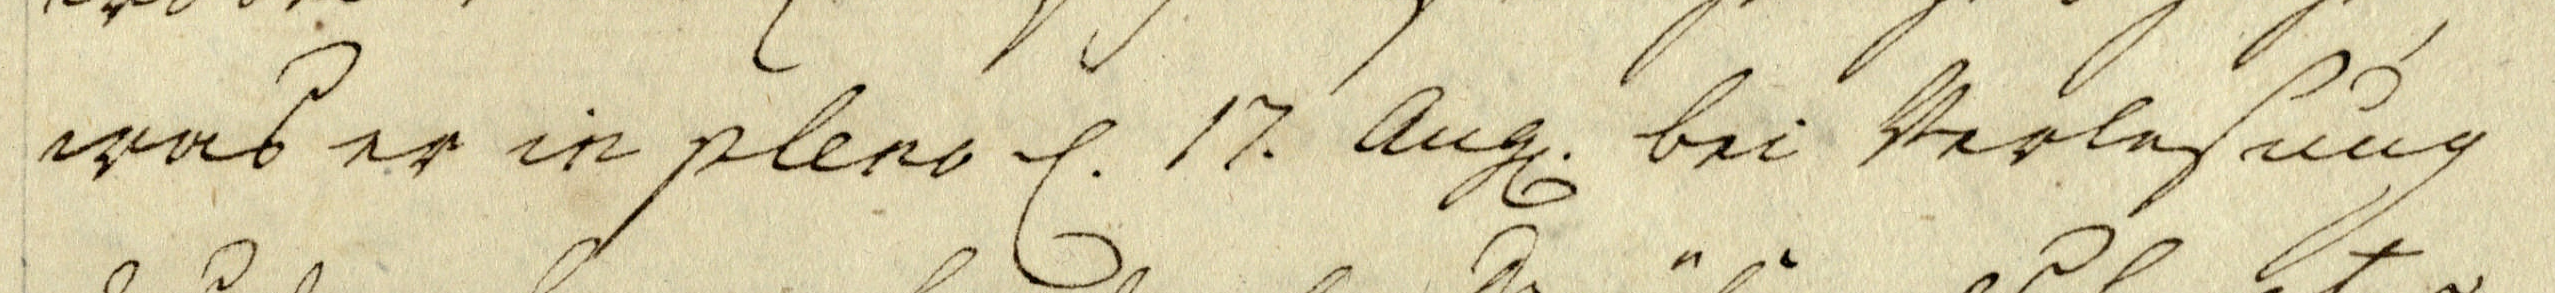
was er in pleno d. 17. Aug. bei Verlesung
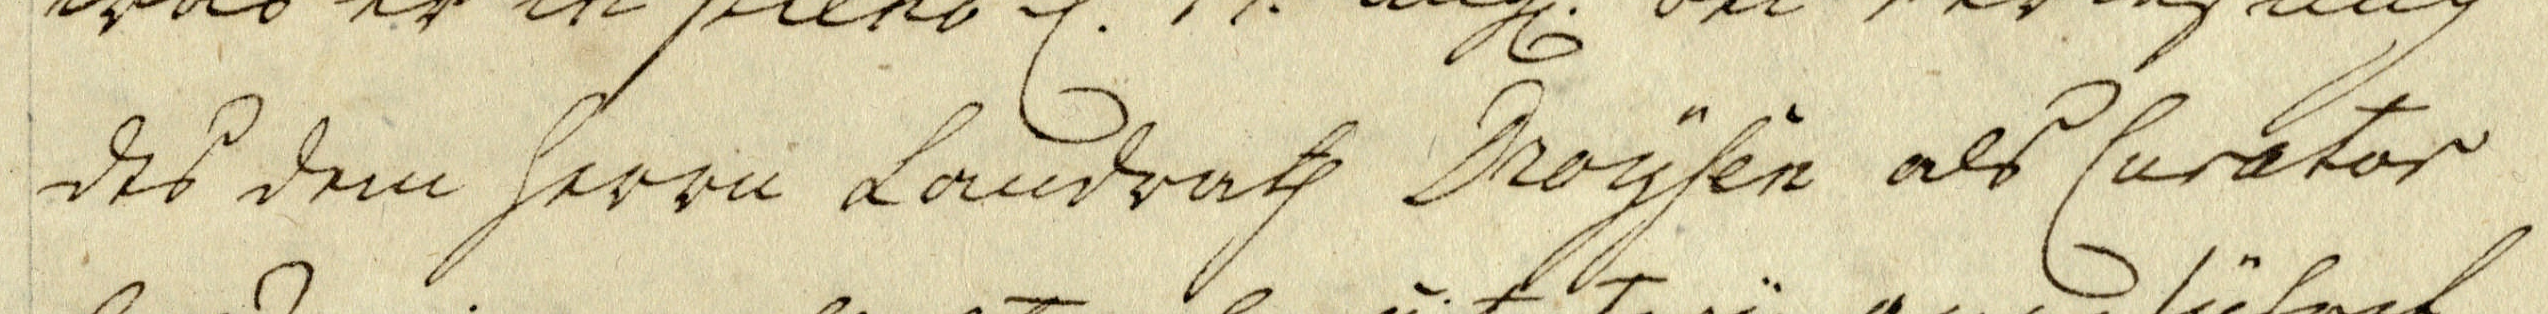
des dem Herrn Landrath Droÿsen als Curator
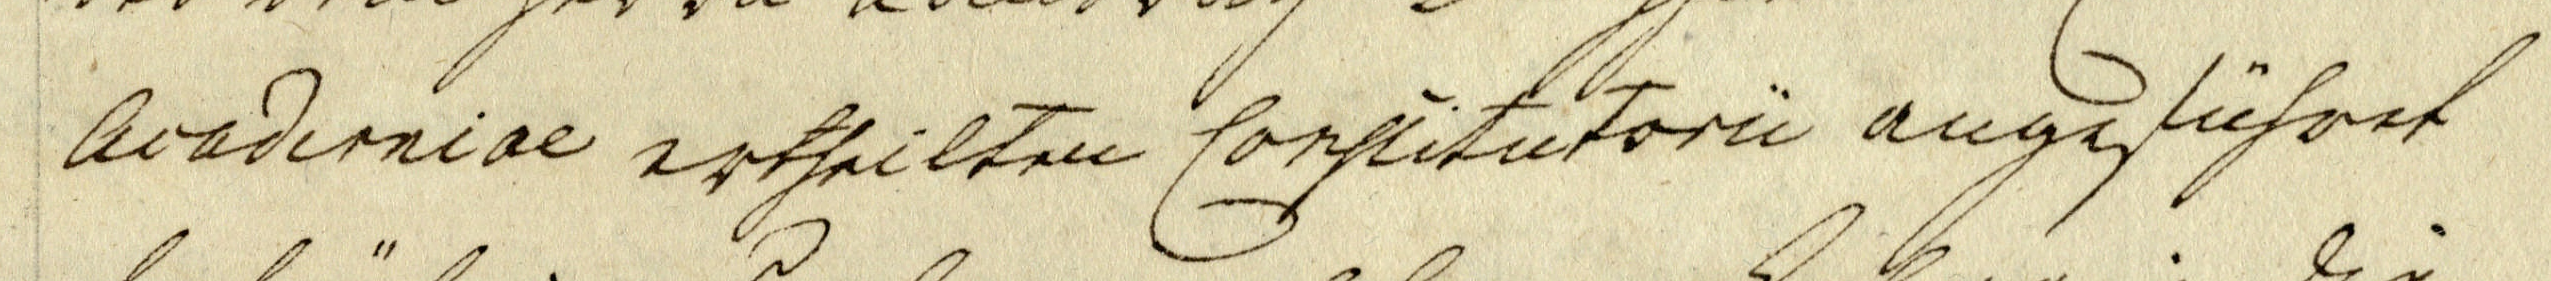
Academiae ertheilten Constitutorii angeführet
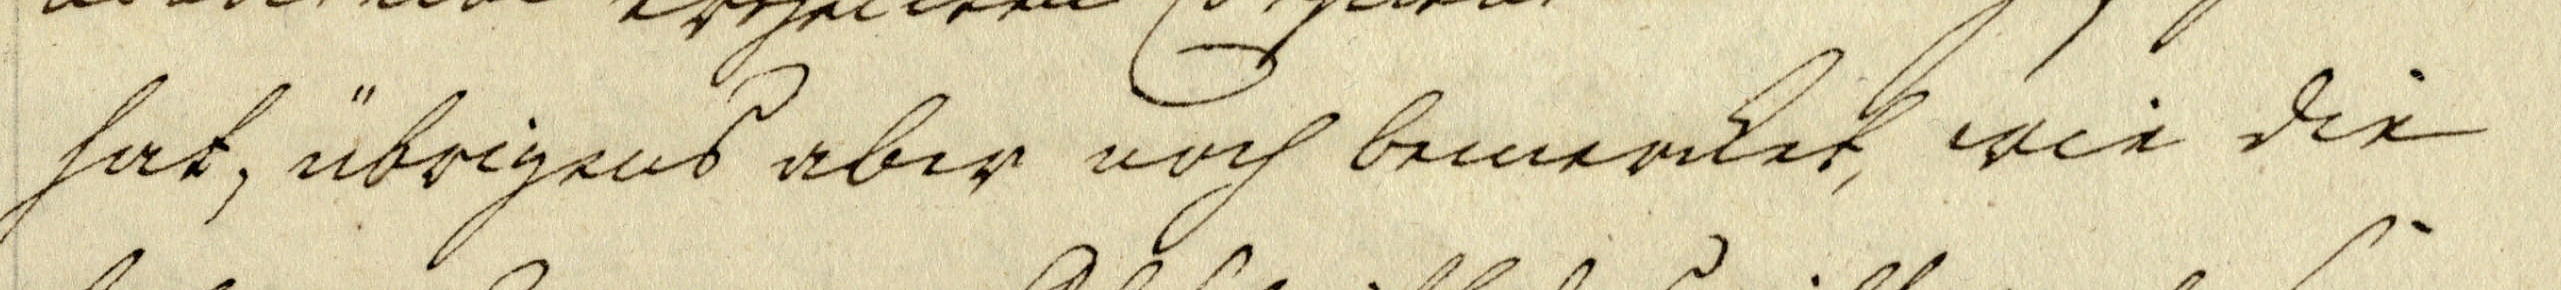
hat, übrigens aber noch bemercket, wie die
